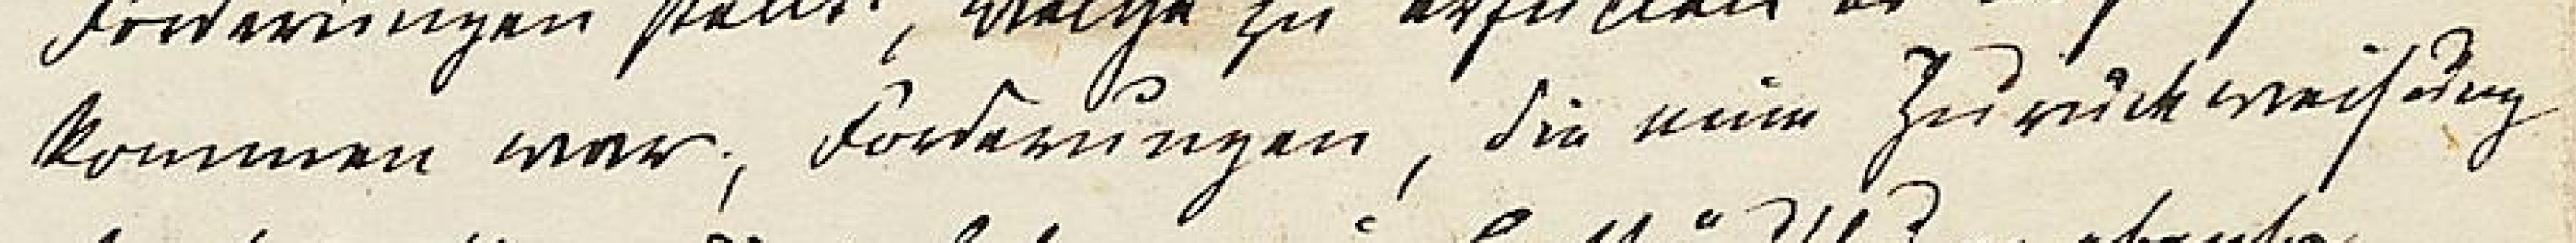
kommen war, Forderungen, die eine Zurückweisung
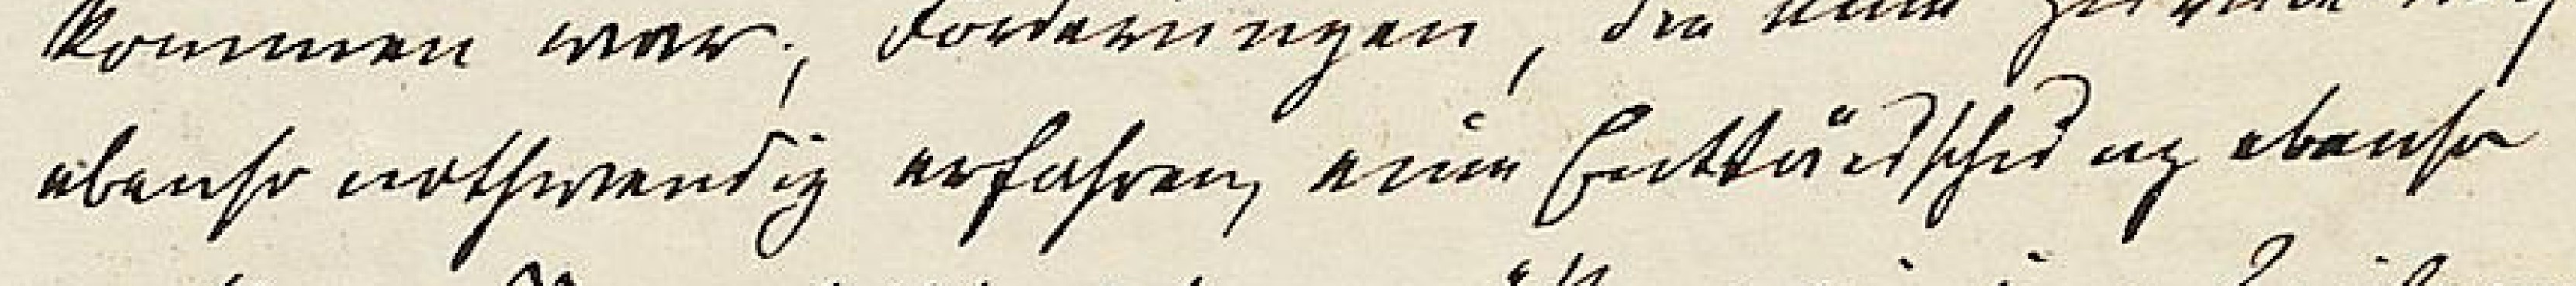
ebenso nothwendig erfahren, eine Enttäuschung ebenso
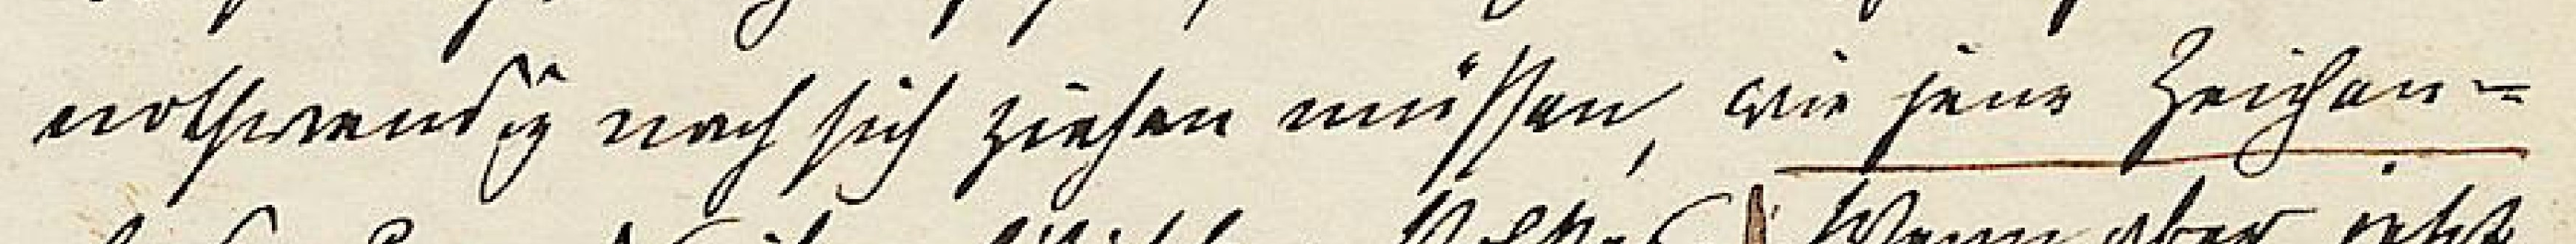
nothwendig nach sich ziehen müssen, wie jene Zeichen¬
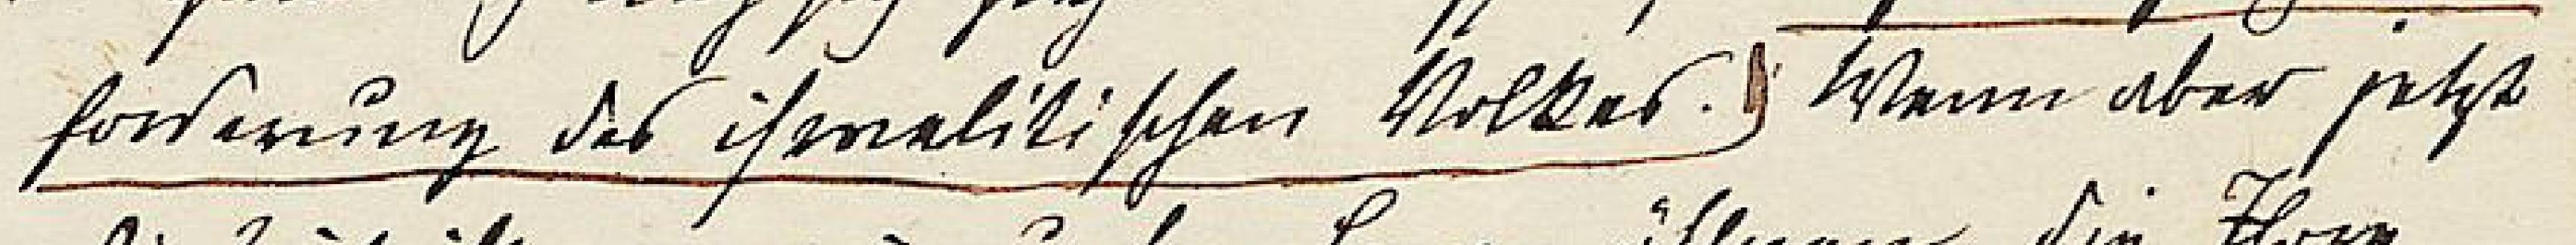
forderung des israelitischen Volkes. Wenn aber jetzt
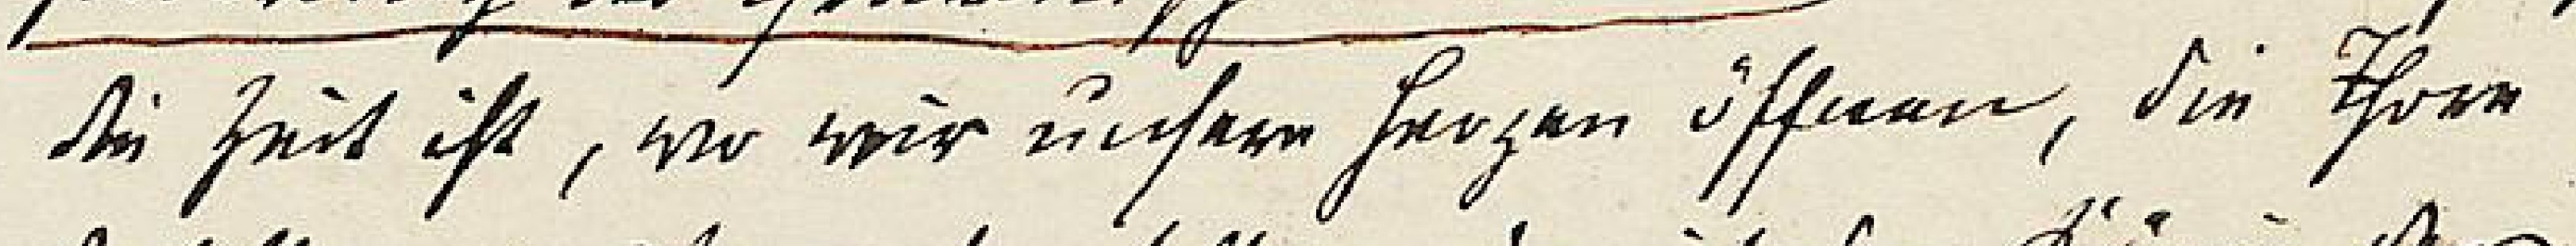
die Zeit ist, wo wir unsere Herzen öffenen, die Thore
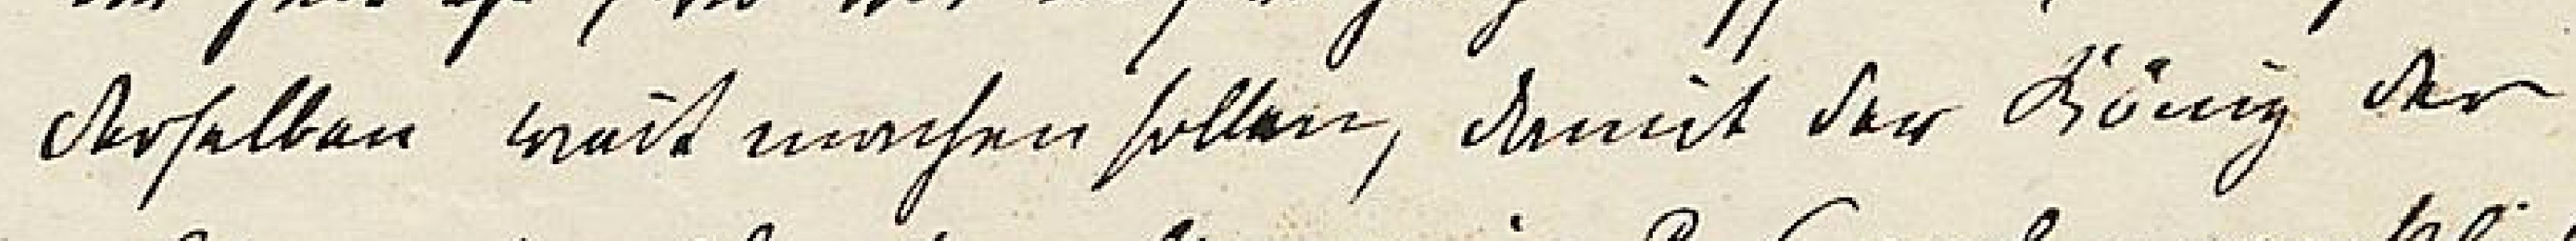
derselben weit machen sollen, damit der König der
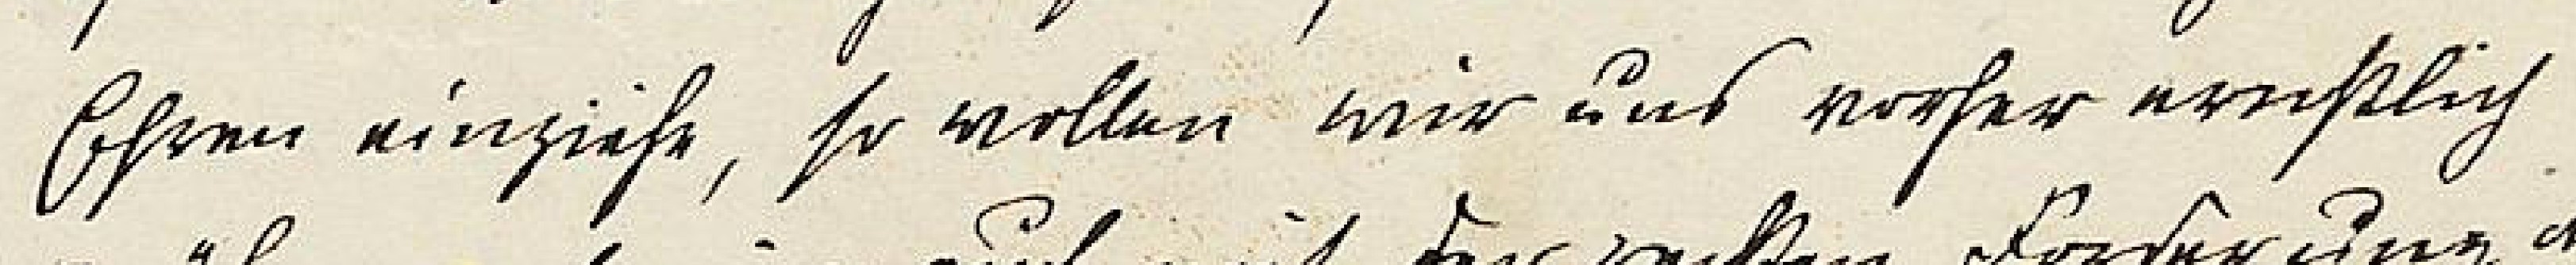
Ehren einziehe, so wollen wir uns voher ernstlich
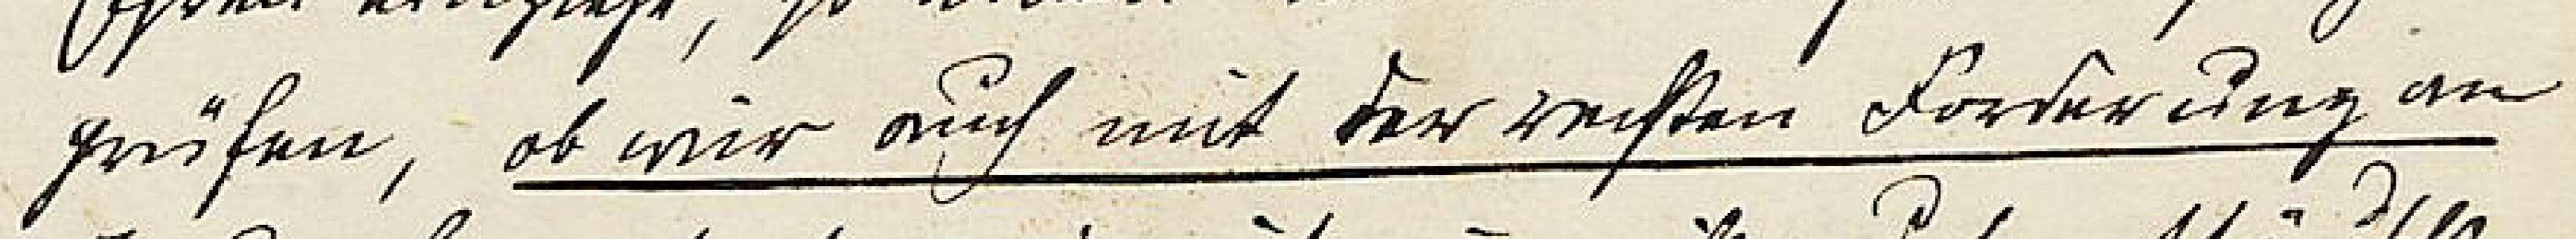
prüfen, ob wir auch mit der richten Forderung an
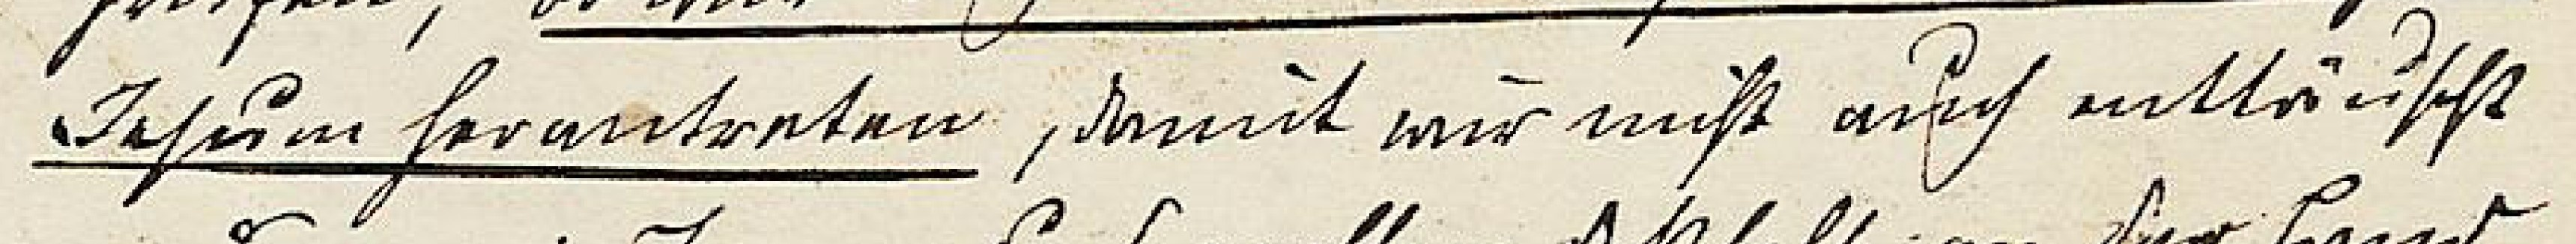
Jesum herantreten, damit wir nicht auch enttäuscht
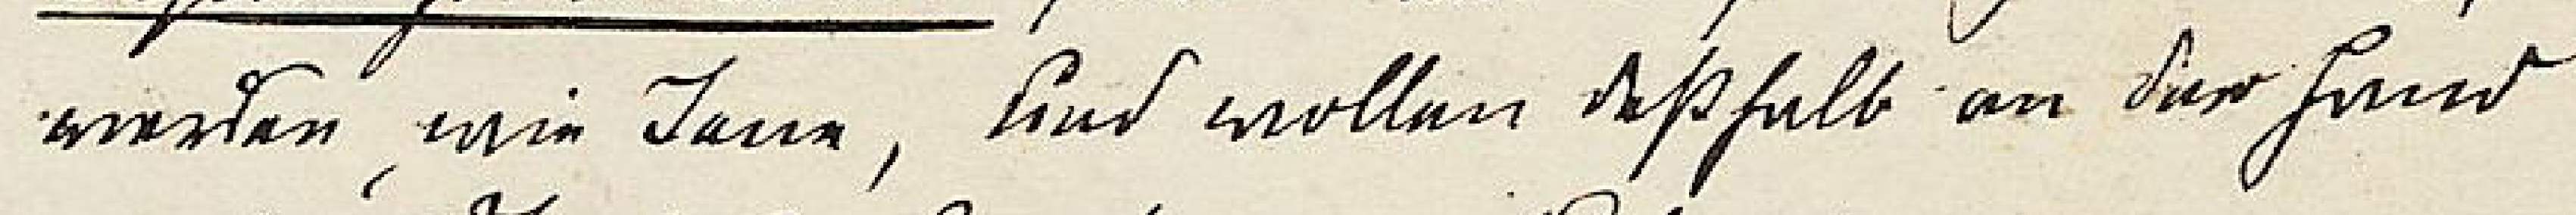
werden, wie Jene, und wollen deßhalb an der Hand
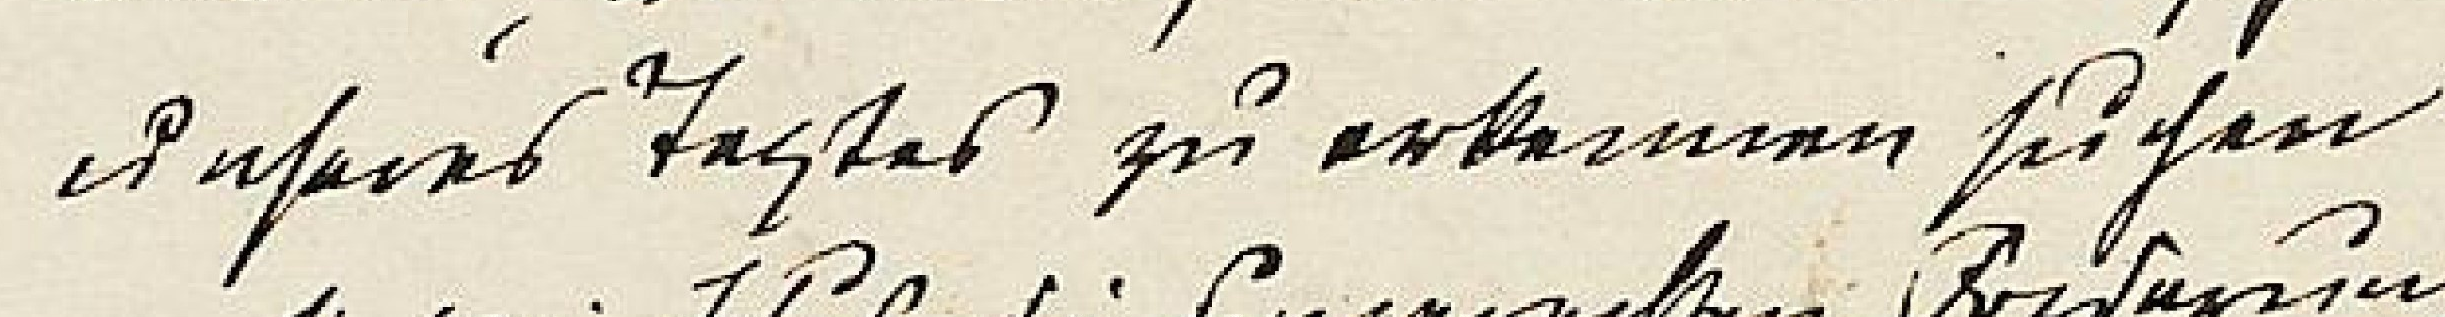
unseres Textes zu erkennen suchen
